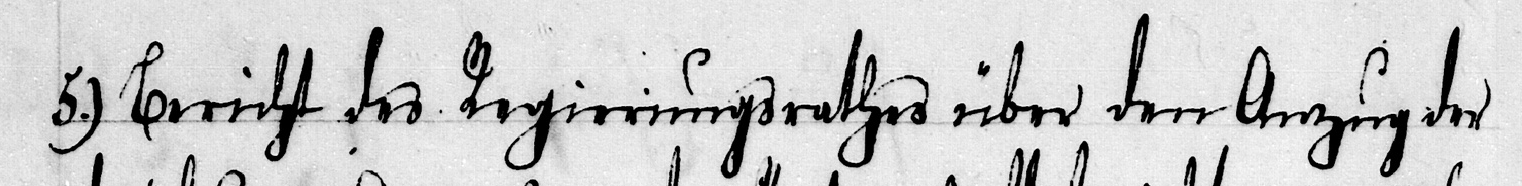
5.) Bericht des Regierungsrathes über den Anzug der
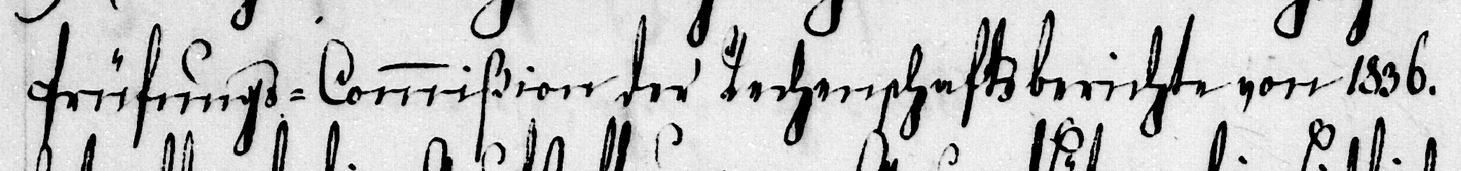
Prüfungs-Commißion der Rechenschaftsberichte von 1836.
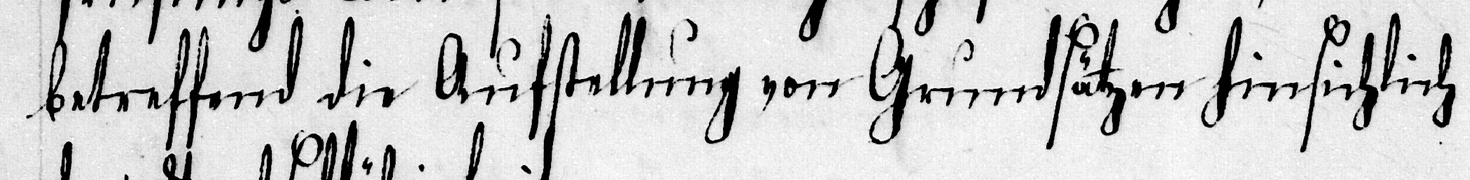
betreffend die Aufstellung von Grundsätzen hinsichtl¬
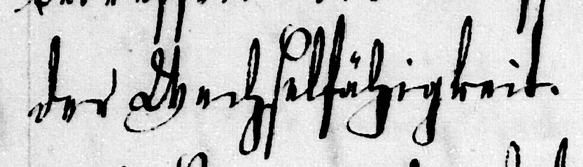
der Wechselfähigkeit.
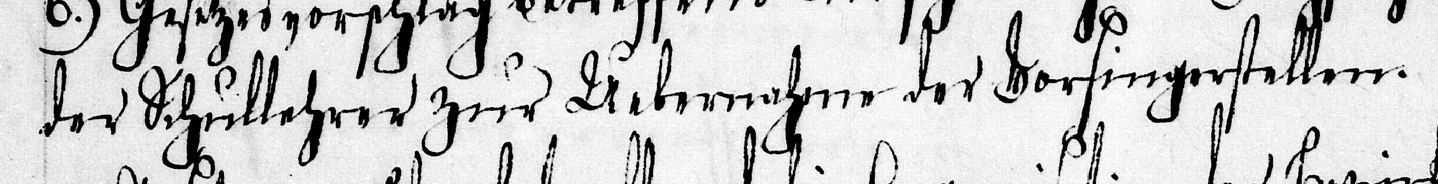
der Schullehrer zur Uebernahme der Vorsingerstellen.
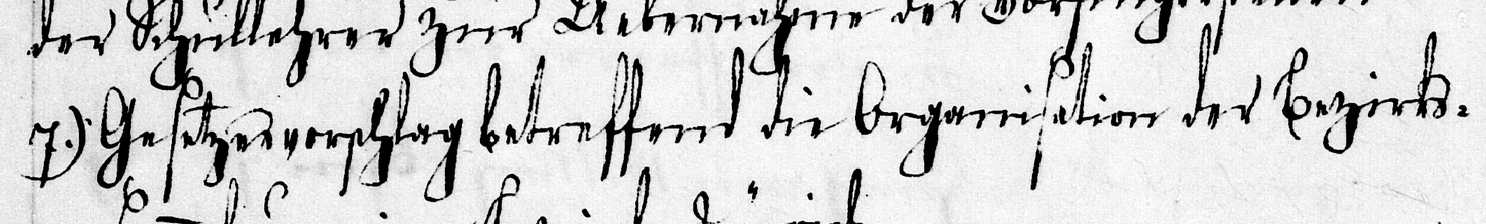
7.) Gesetzesvorschlag betreffend die Organisation der Bezirks¬
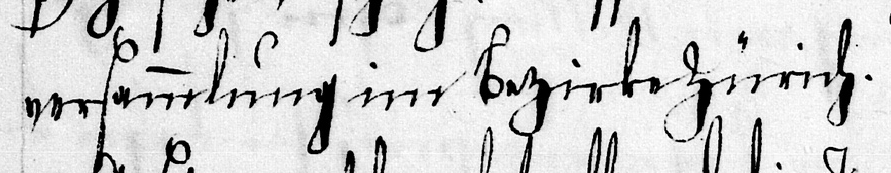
versammlung im Bezirke Zürich.
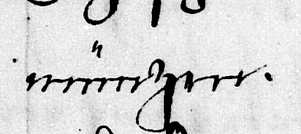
münzen.
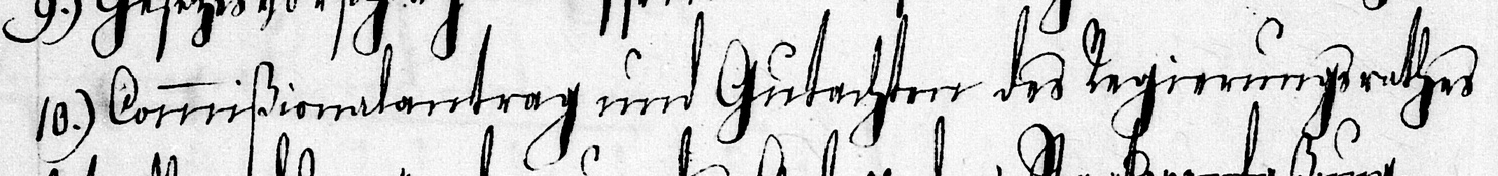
10.) Commißionalantrag und Gutachten des Regierungsrathes
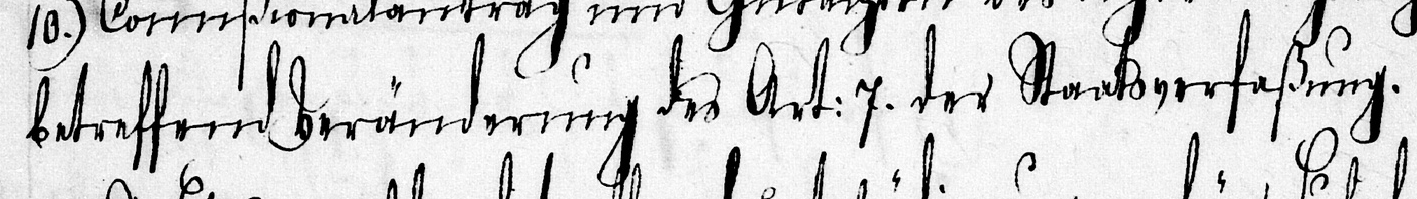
betreffend Veränderung des Art: 7. der Staatsverfaßung.
